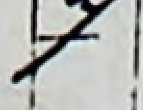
7
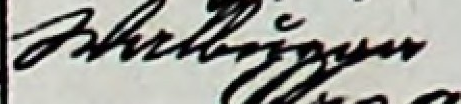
Walburga
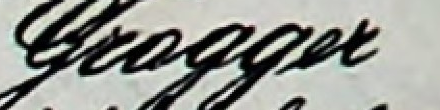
Grogger
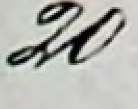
20
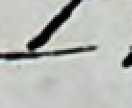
I
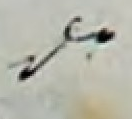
do
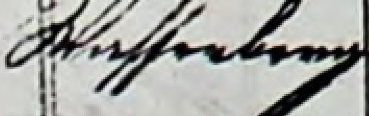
Wassenberg
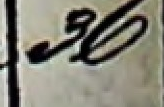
36
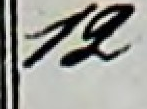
12
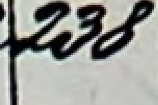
238
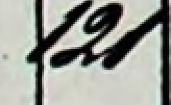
121
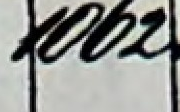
1062
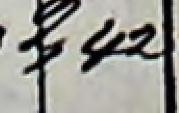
2,42
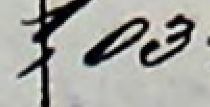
1,03
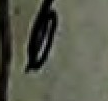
6
